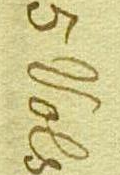5 Vols.
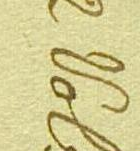2 Vols.
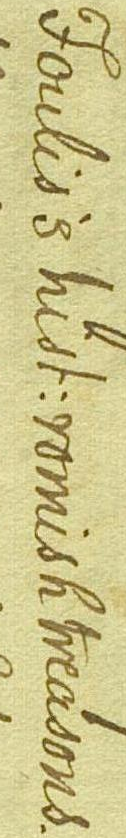Foulis's hist: romish treasons.
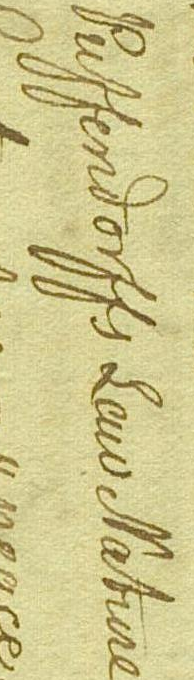Puffendorffs Law Nature.
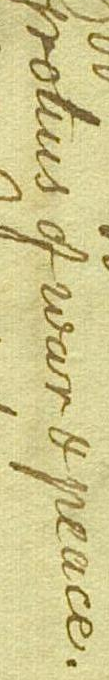Grotius of war & peace.
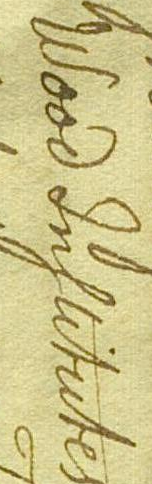Wood Institutes
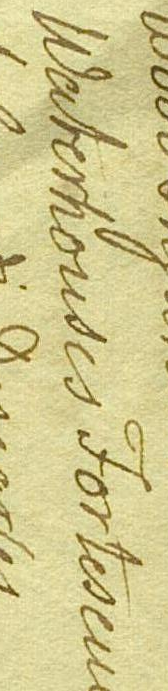Waterhouses Fortescue
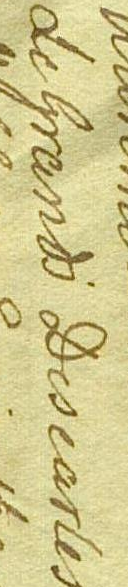Le Grand's Descartes
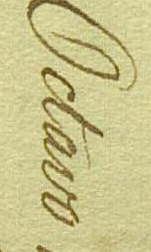Octavo
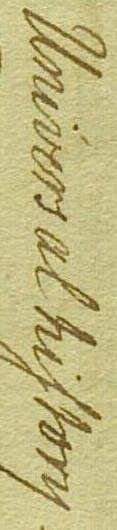Universal history
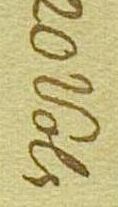20 Vols
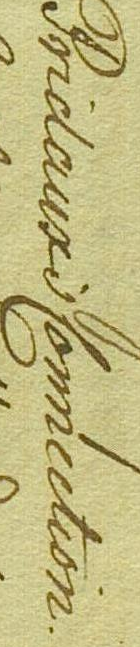Pridaux's Connection.
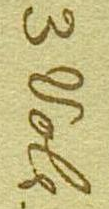3 Vols.
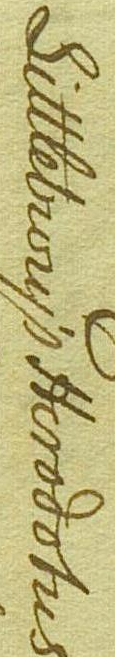Littlebury's Herodotus
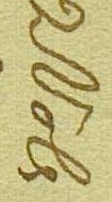2 Vols
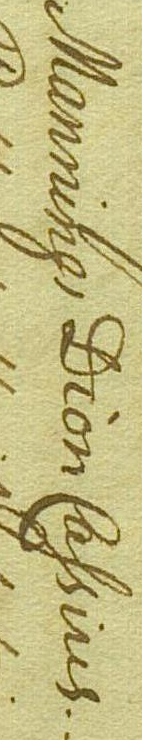Mannings Dion Cassius.
